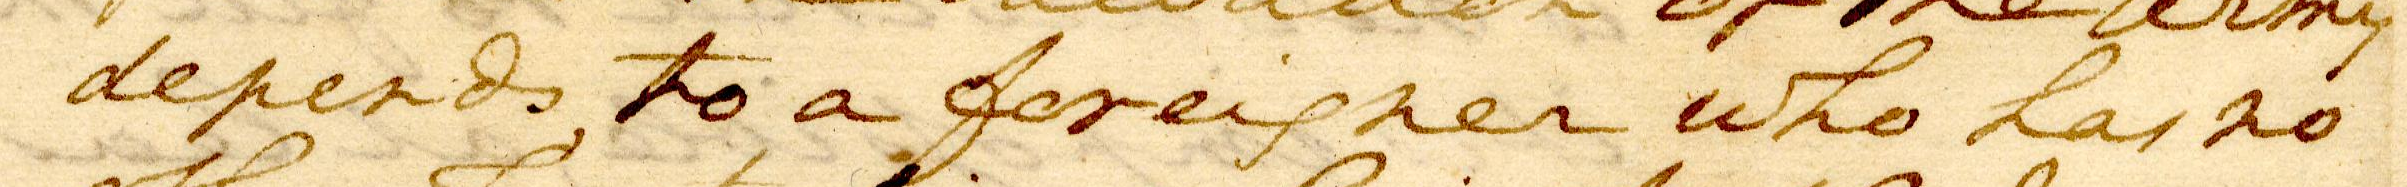depends, to a foreigner who has no
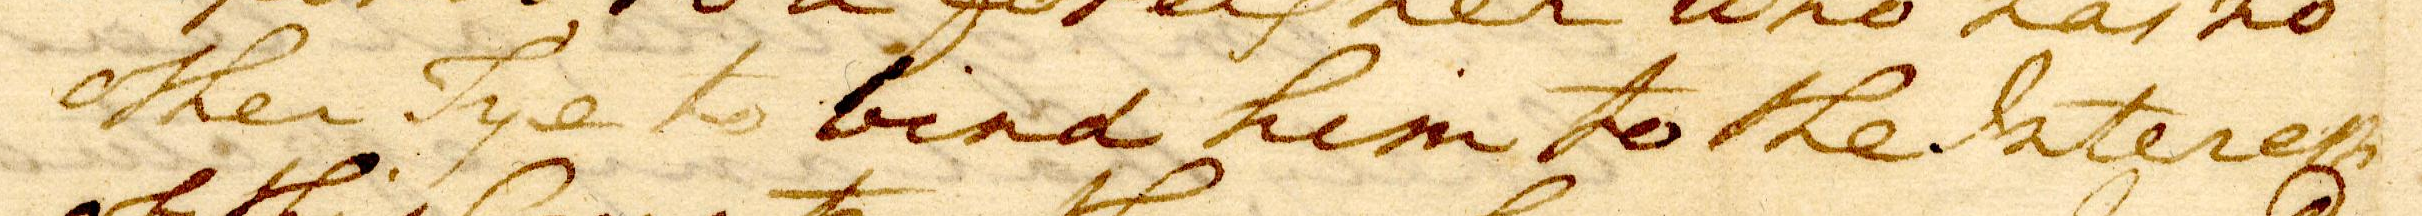other Tye to bind him to the Interests
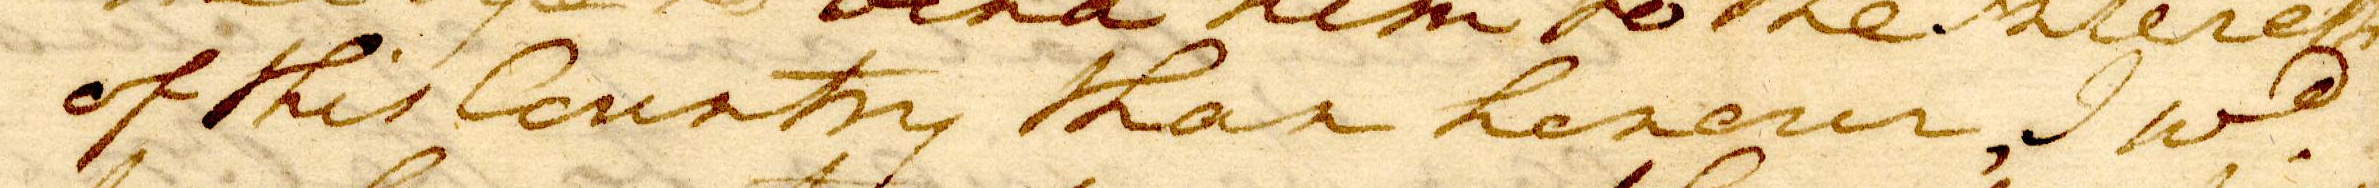of this Country than honour, I w^d.
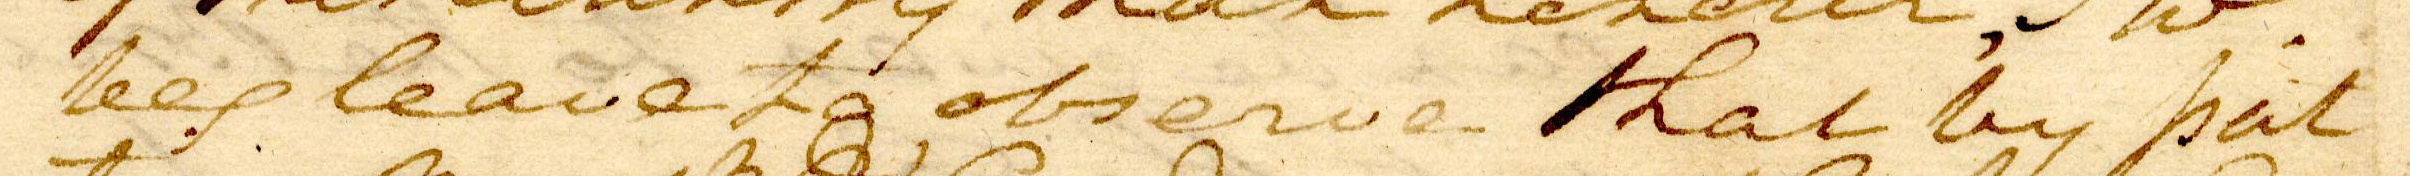beg leave to observe that by put-
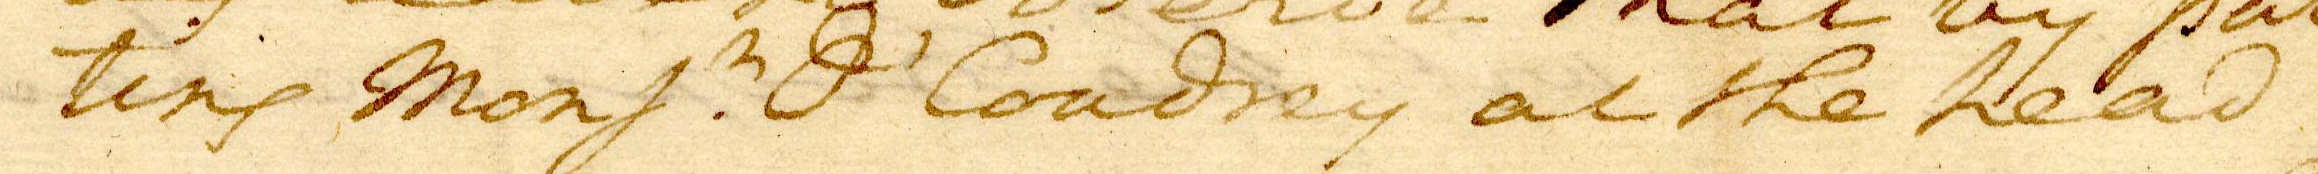-ting Mons^r. D'Coudrey at the head
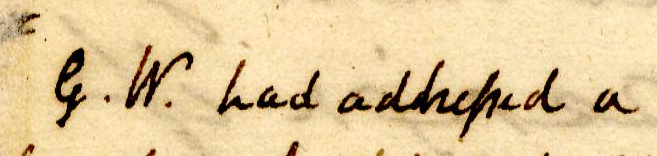G. W^s. had attached a
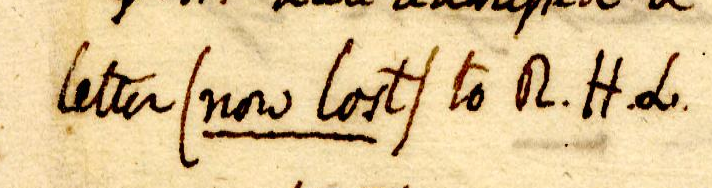letter (now lost) to R.H.L
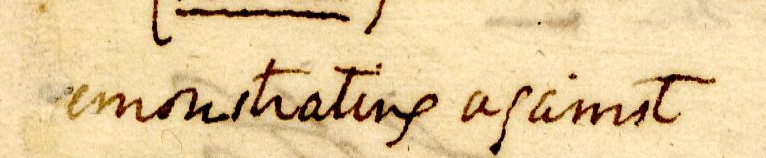demonstrating against
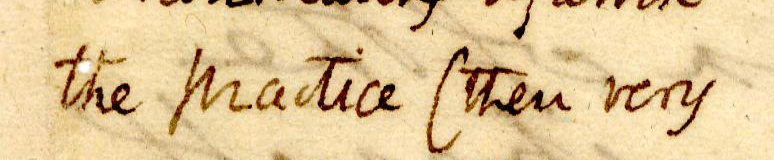the practice (then very
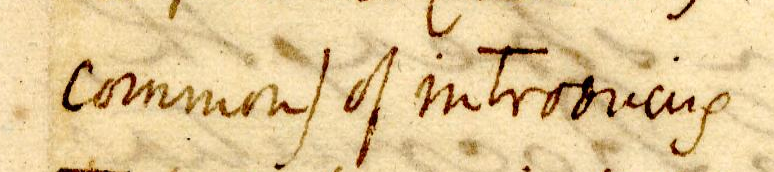common) of introducing
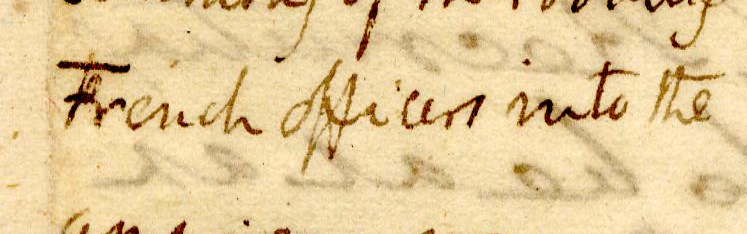French officers into the
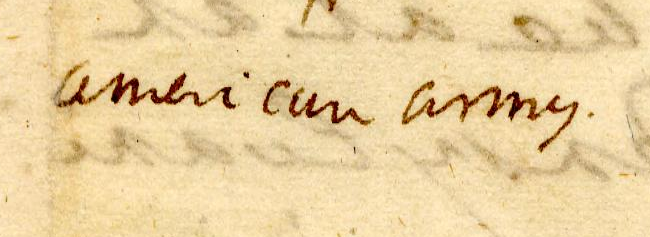American Army
